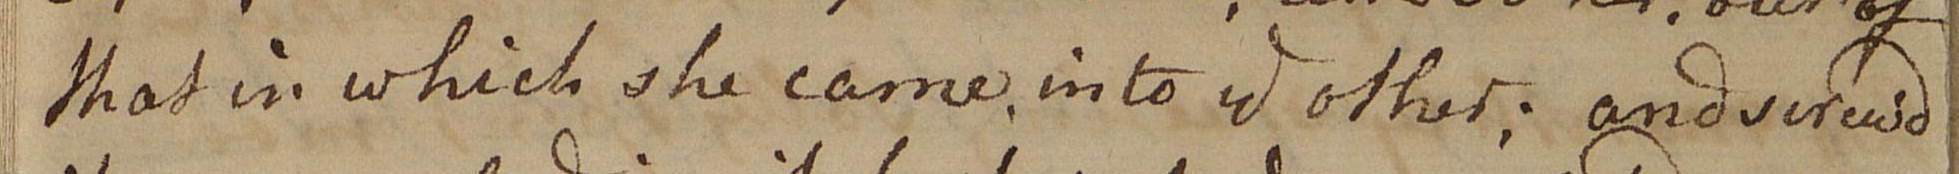that in which she came, into y^e other, and screw'd
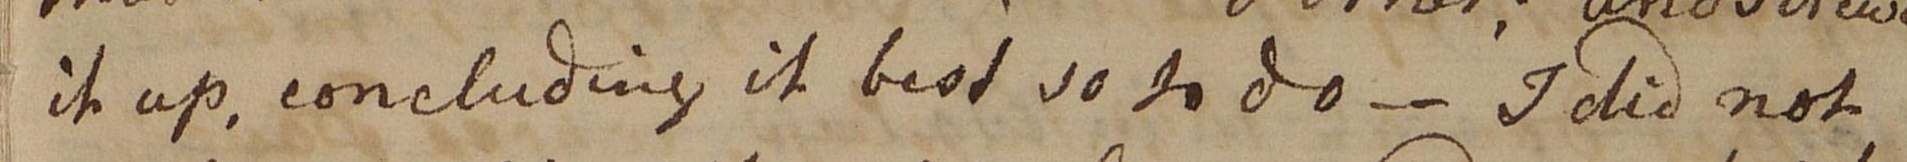it up, concluding it best so to do- I did not
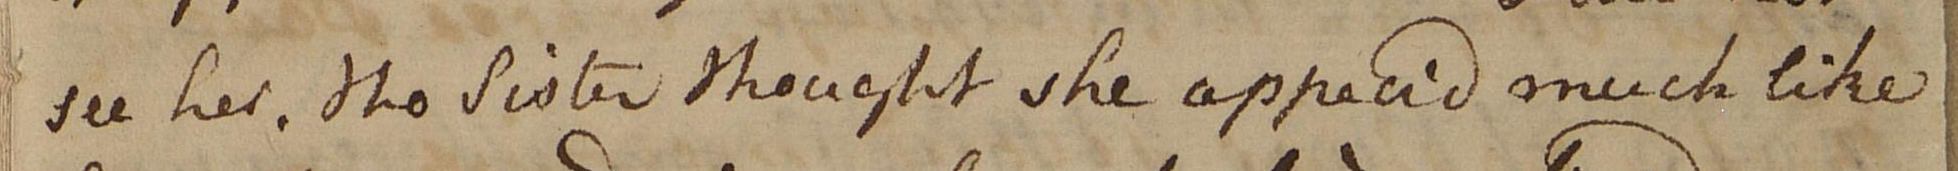see her, tho Sister thought she appea'd much like
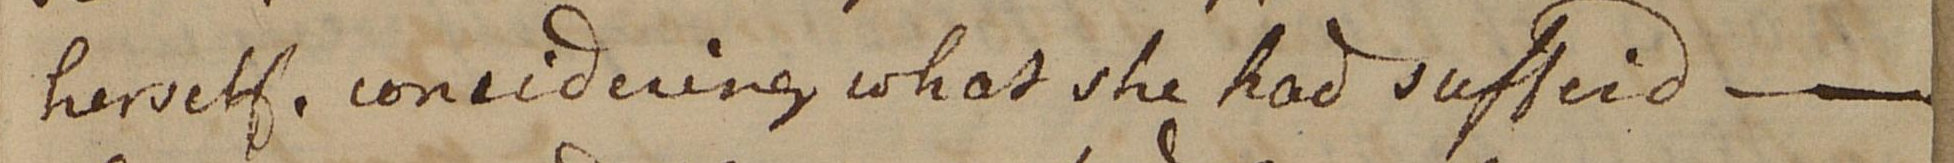herself, considering what she had suffer'd-
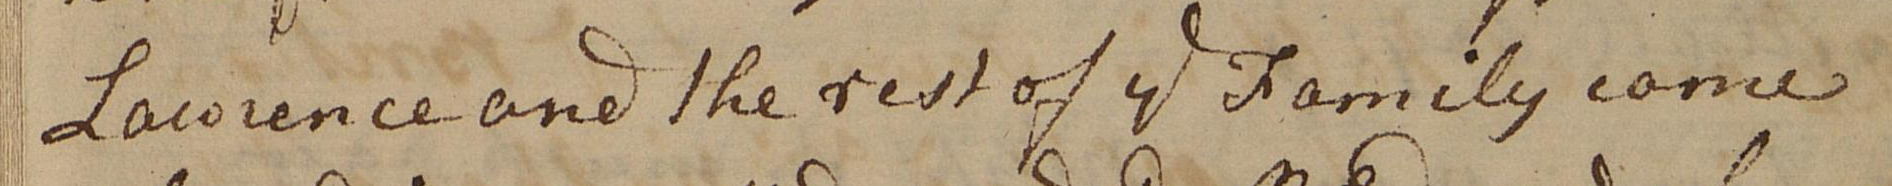Lawrence and the rest of y^e Family come
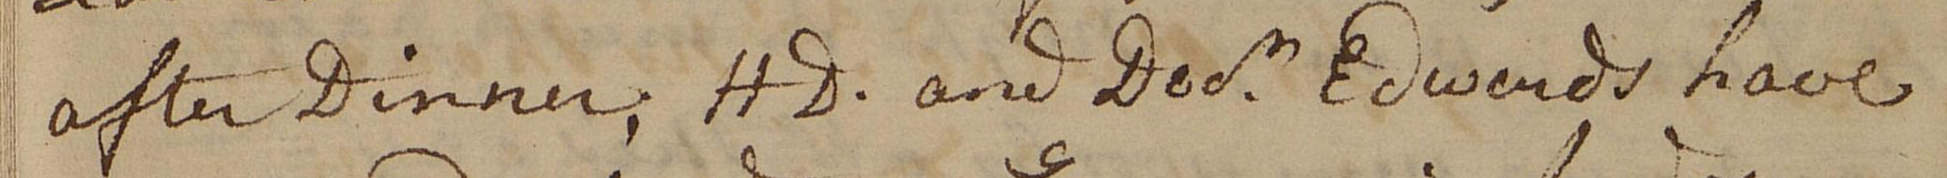after Dinner, HD and Dec^r. Edwards have
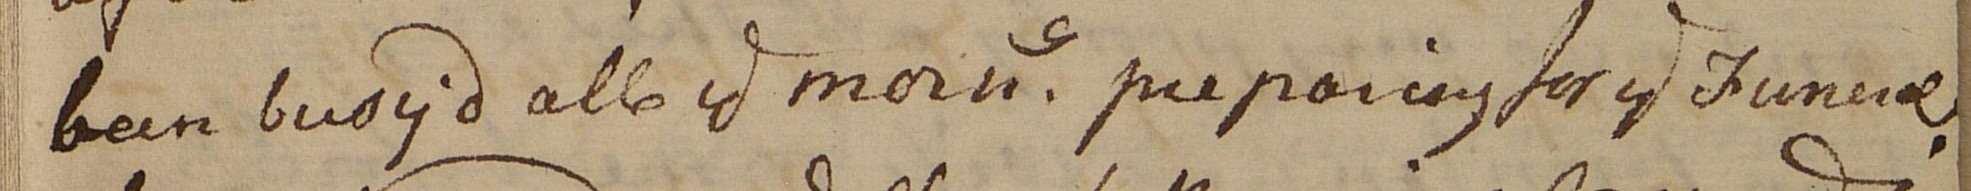been busy'd all y^e morn^g. preparing for y^e Funeral
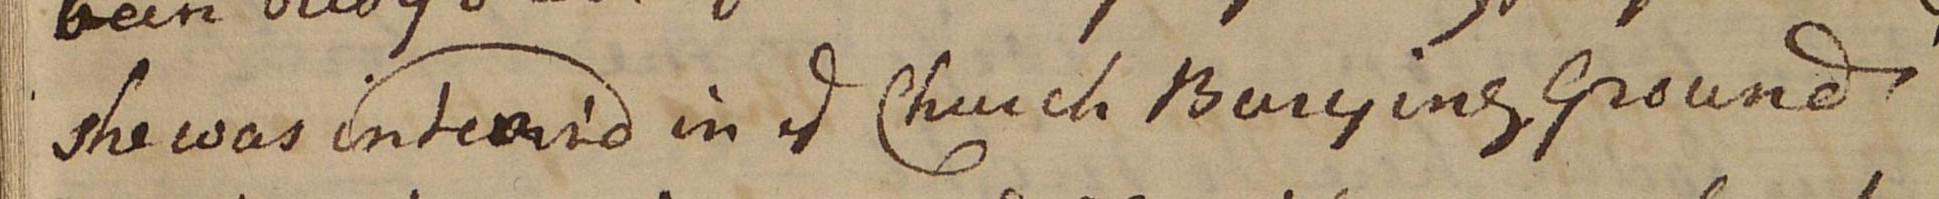she was interr'd in y^e Church Burying Ground
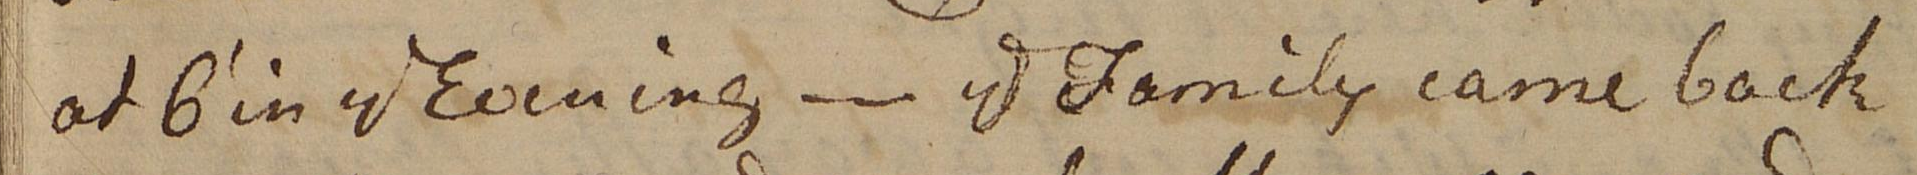at 6 in y^e Evening- y^e Family came back
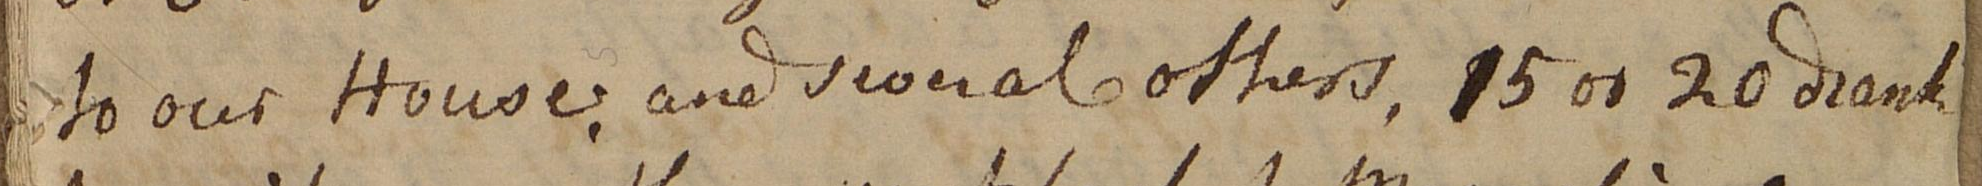to our House and several others, 15 or 20 drank
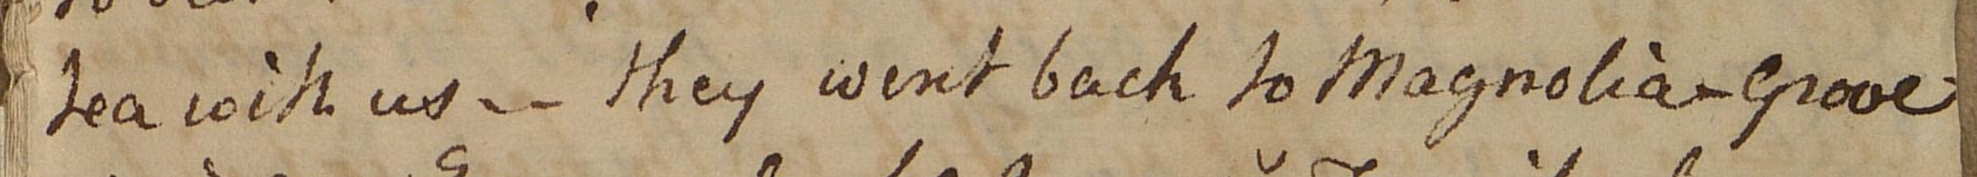tea with us- they went back to Magnolia-Grove
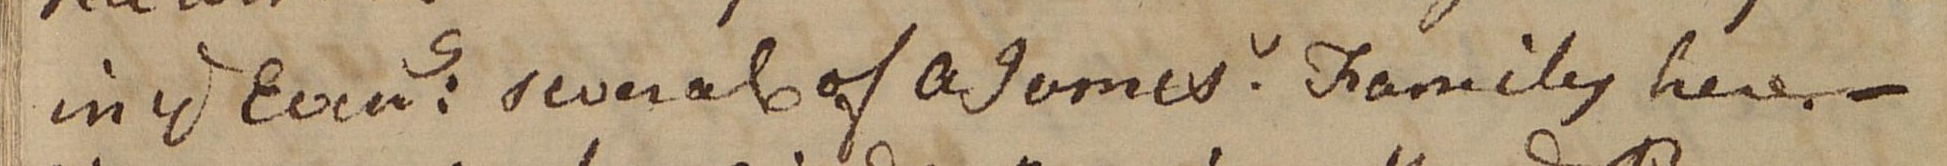in y^e Even^g: several of a James^s Family here.-
